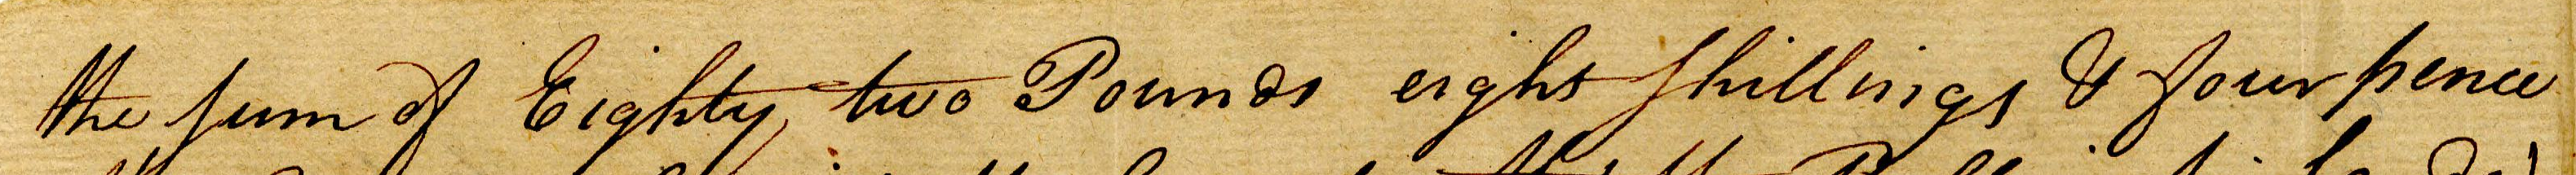the sum of Eighty-two Pounds eight shillings & four pence
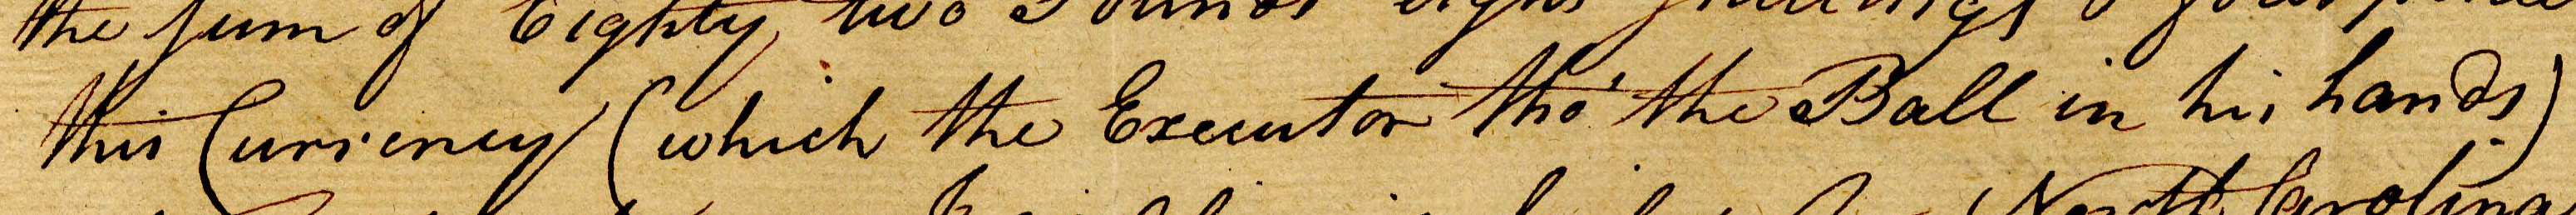this Currency (which the Executor tho' the Ball in his hands)
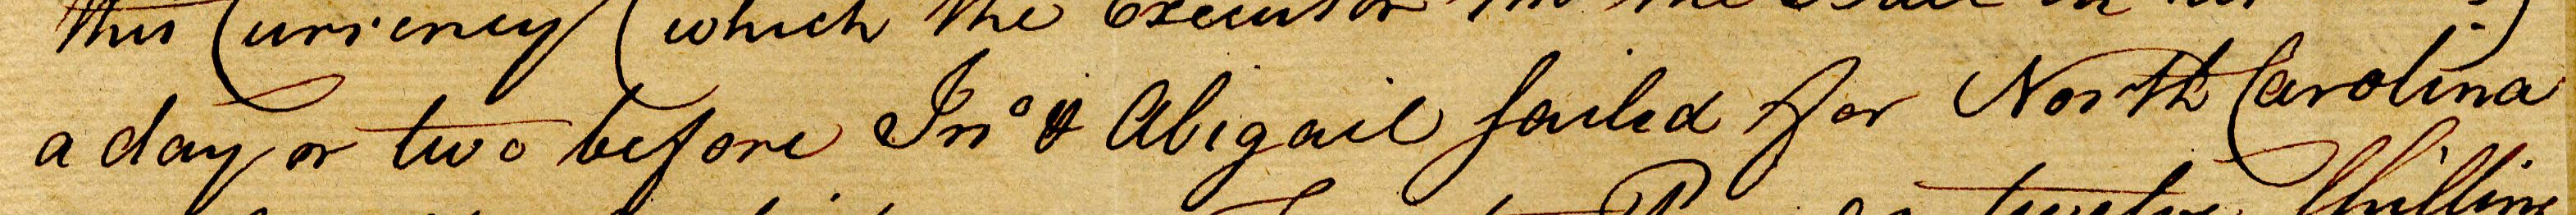a day or two before Jn^o & Abigail sailed for North Carolina
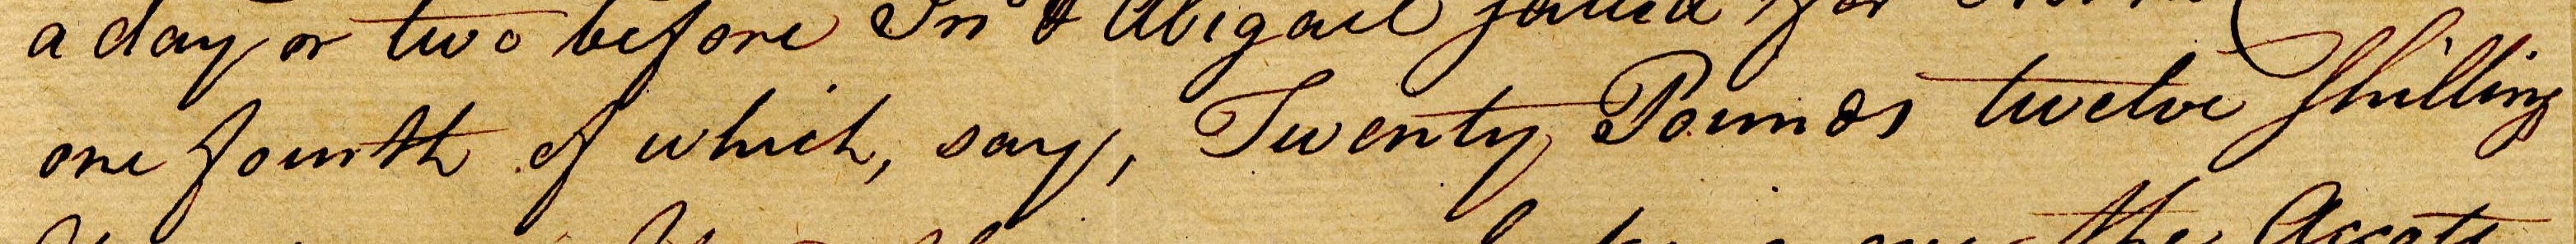one fourth of which, say, Twenty Pounds twelve shillings
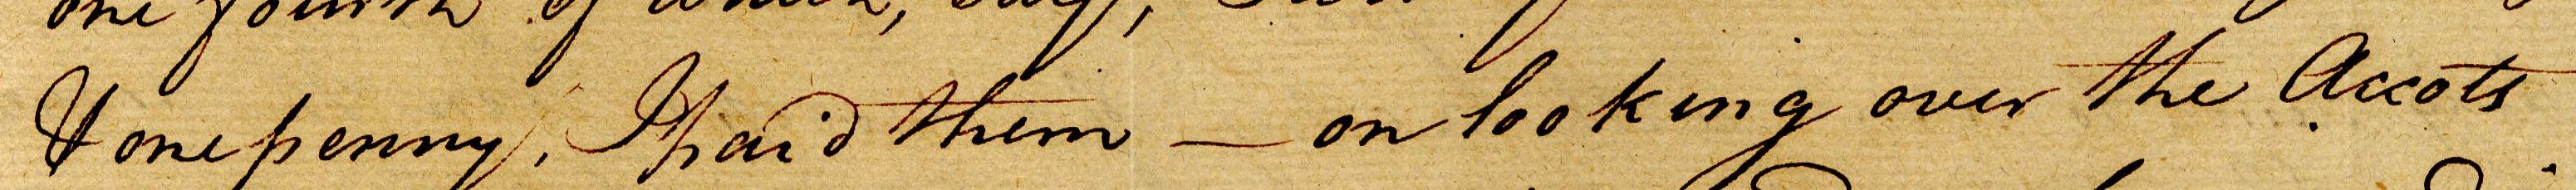& one penn, I paid them- on looking over the Accots
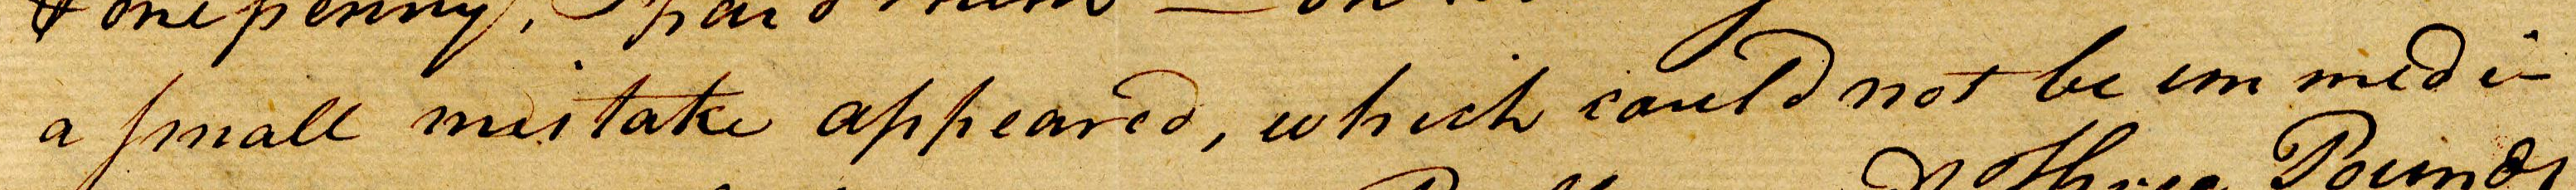a small mistake appeared, which could not be imedi-
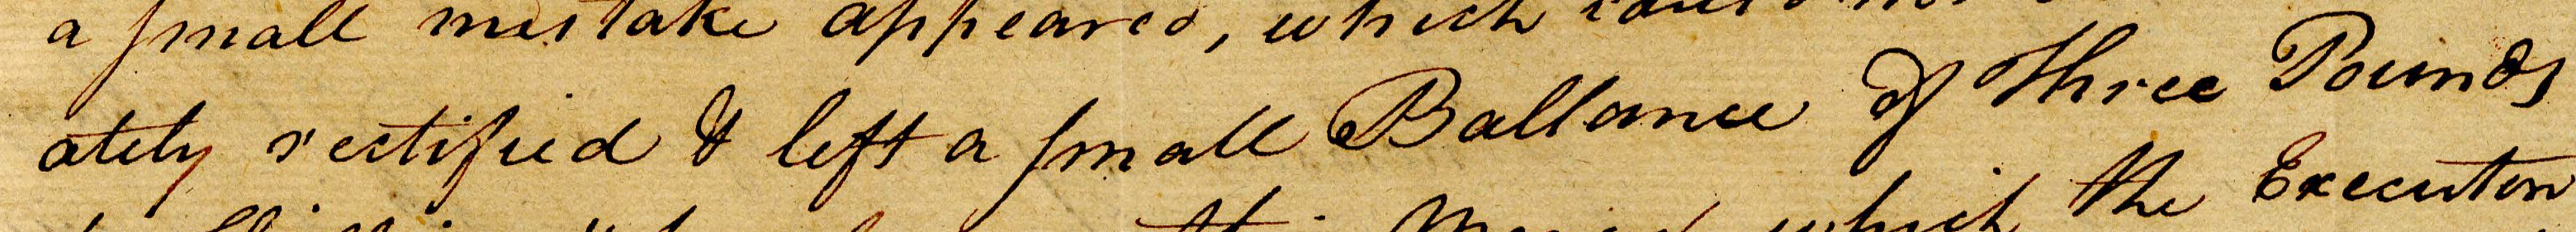ately rectified & left a small Ballance of three Pounds
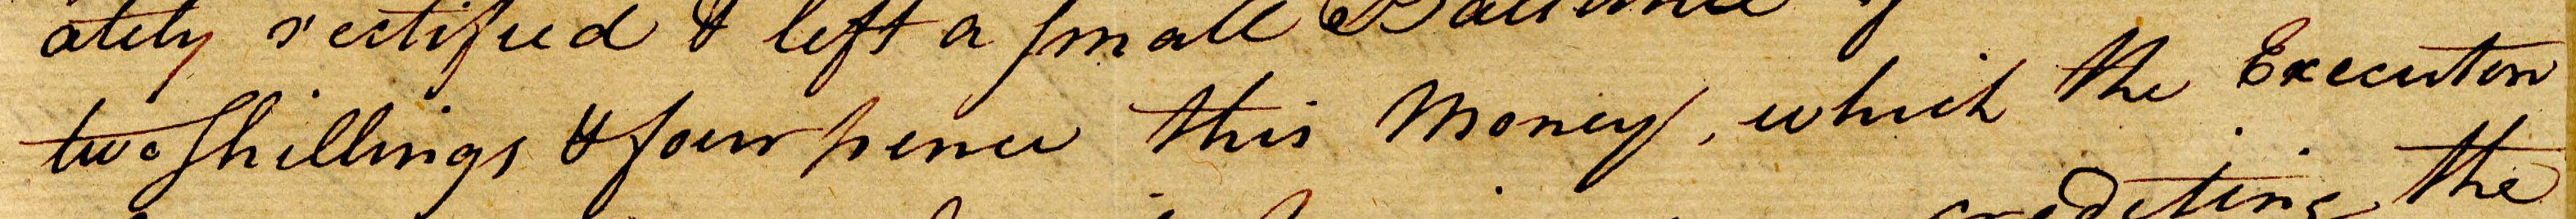two shillings & four pence this money, which the Executor
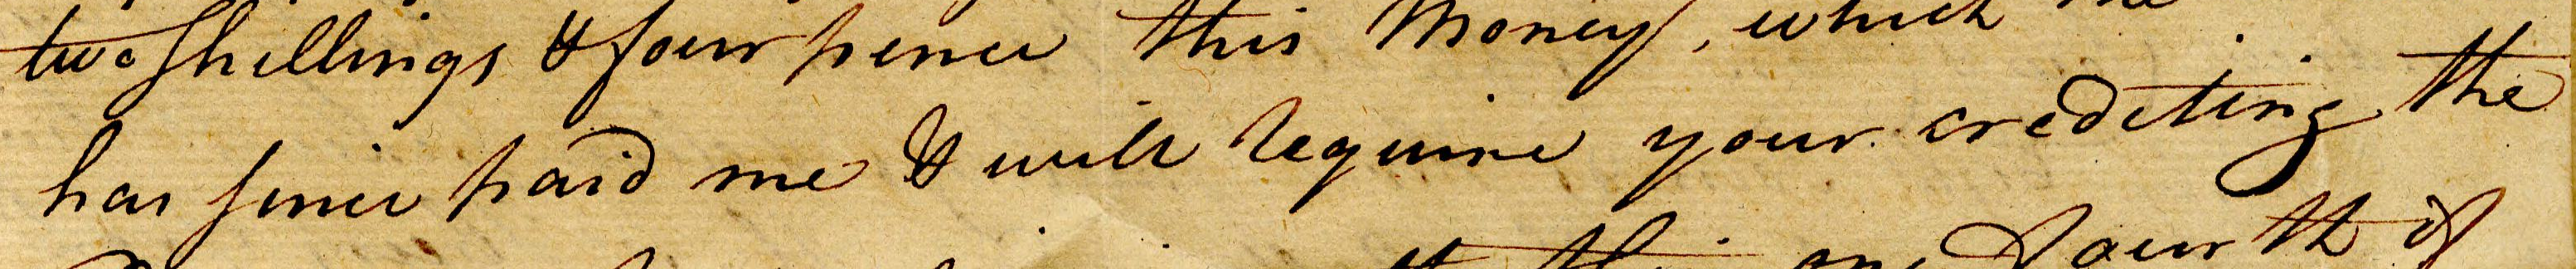has since paid me & will require your crediting the
